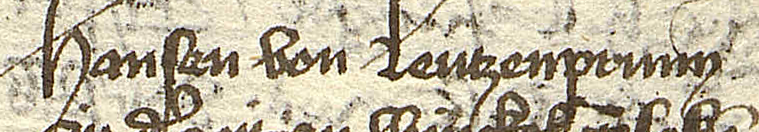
Hanſen von Leutʒenprunn
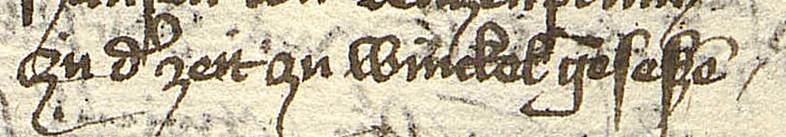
cʒü d* ʒeit cʒu winckel geſeſʒe* /
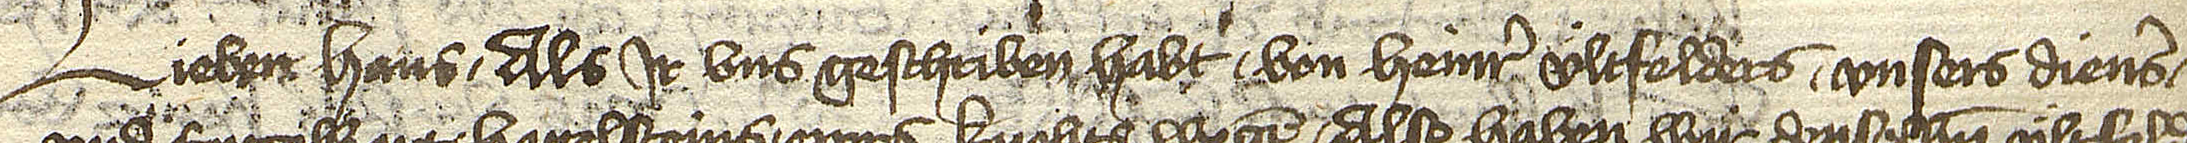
Lieber hans / Als Ir vns geſchriben habt / von heinr* v̈ltfelders / vnſers diens* /
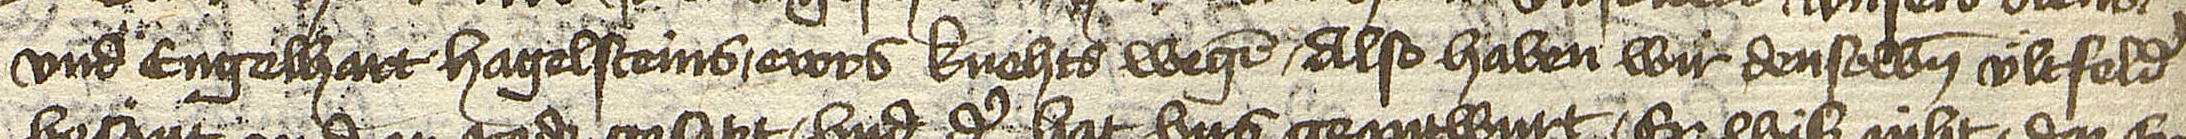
vnd Engelhart hagelſteins / ewrs knechts wege* / Alſo haben wir denſelbn* v̈ltfeld*
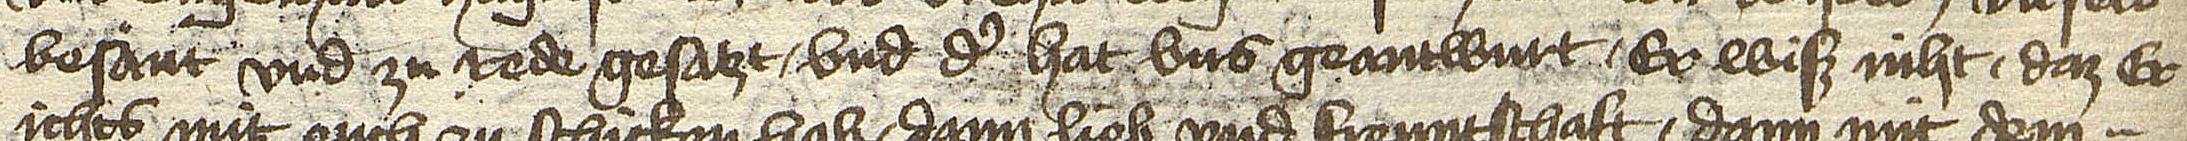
beſant vnd ʒu rede geſatʒt / vnd d* hat vns geantwurt / Er wiſʒ niht / daʒ Er
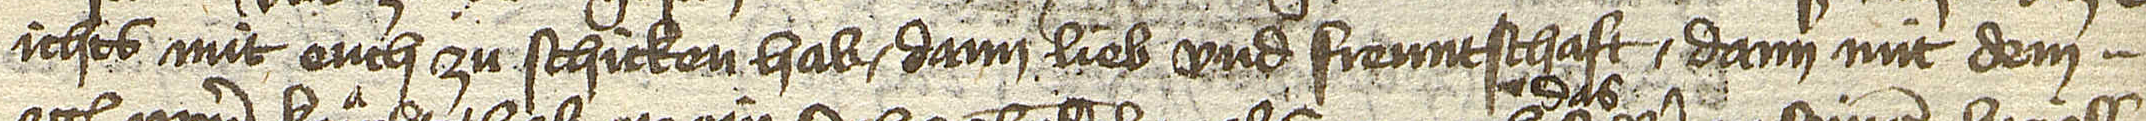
ichts mit euch cʒu ſchicken hab / dann lieb vnd freuntſchaft / dann mit dem ~
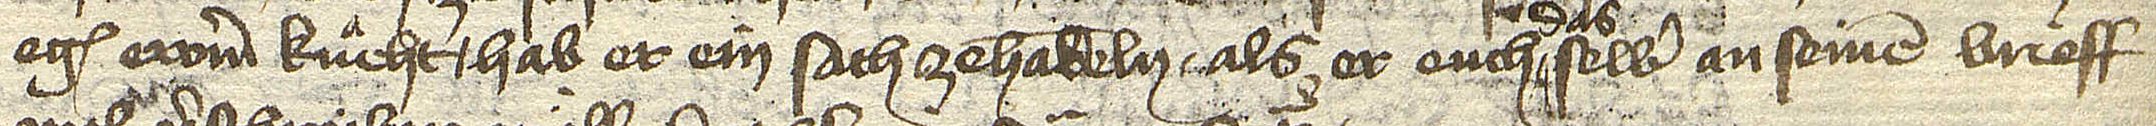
eg* ewn* knëcht / hab er ein ſach cʒehad*eln / als er euch ſelb* an ſeine* brieff
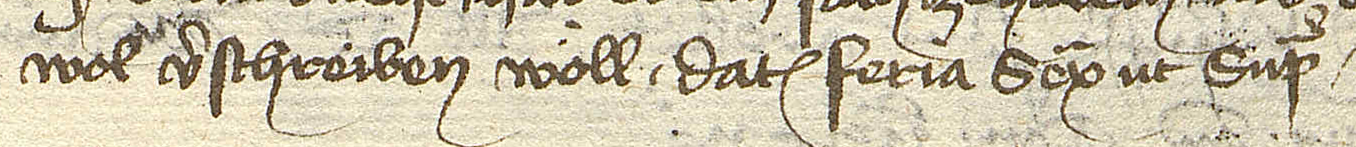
wol v*ſchreiben wöll / dat* feria Sex* ut Sup* /
